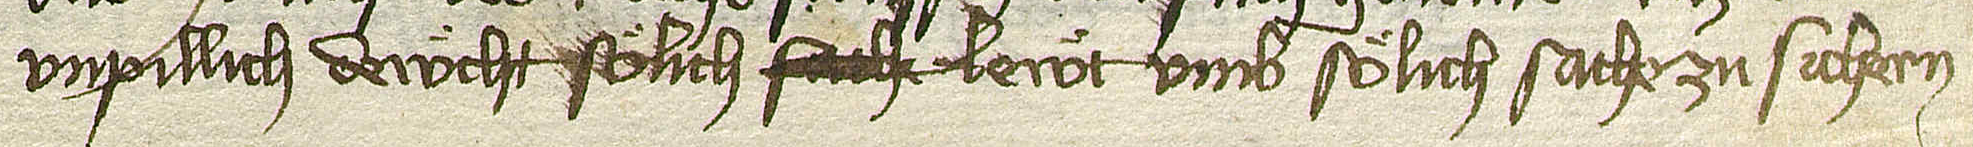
vnpillich dewcht ſölich ſache lewt vmb ſölich ſache ʒu ſichern
